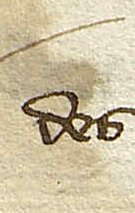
des
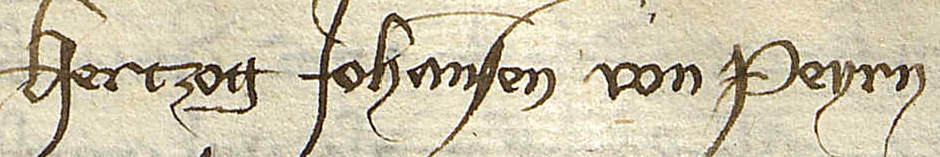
Hercʒog Iohanſen von Peyrn
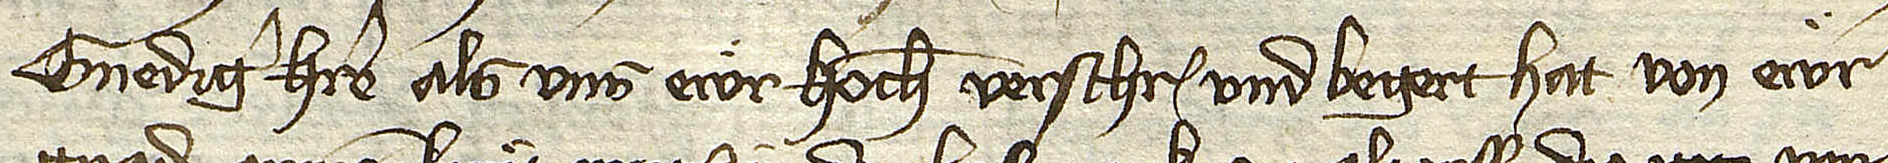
Gnedig* h*re als vns ewr hoch* verſchr* vnd begert hat von ew*r
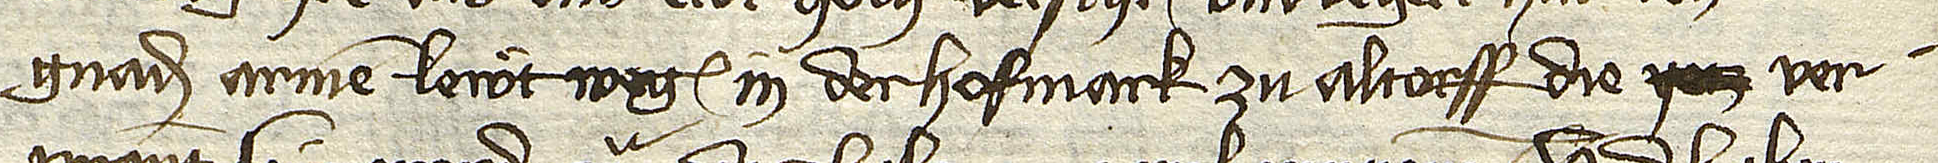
gnad* arme* lewt weg* in der hofmark ʒu altorff die yecʒ ver -
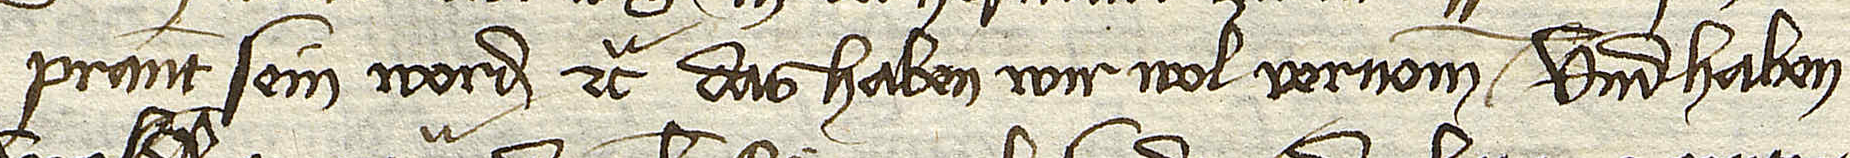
pran*t ſein word* ec* das haben wir wol vernom* / Vnd haben
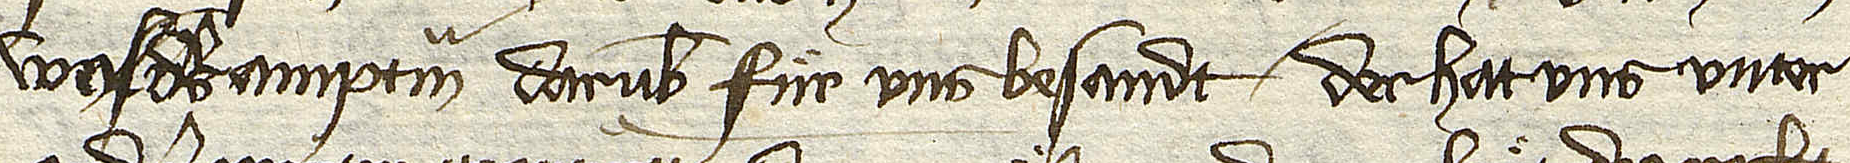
walds amptm* daru*b für vns beſandt / der hat vns vnter
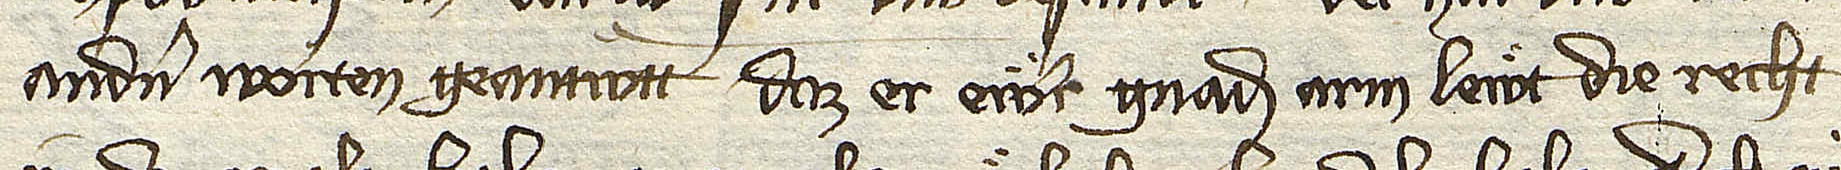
and*n worten geantw*tt / daʒ er ew*r gnad* arm lewt die recht
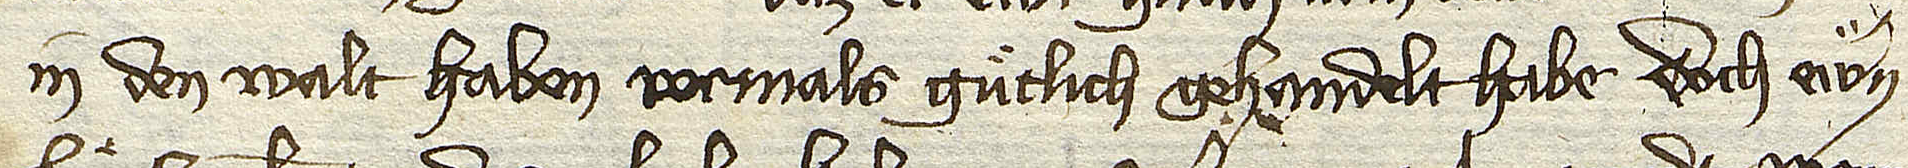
in den walt haben vormals gütlich gehandelt habe . Doch ew*n
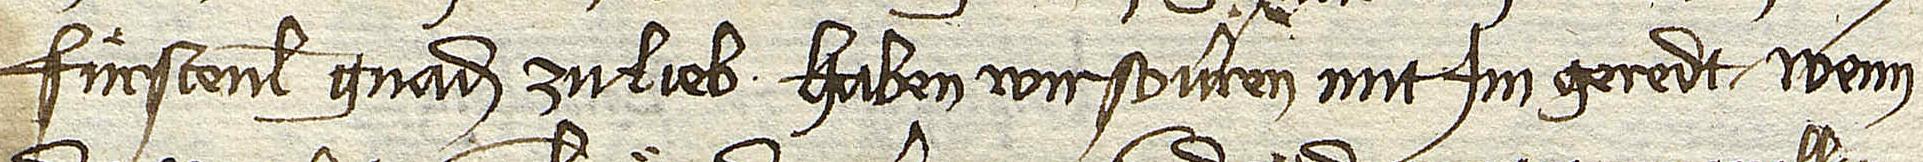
fürſtenl* gnad* ʒu lieb . haben wir ſou*ren mit Im geredt / wenn
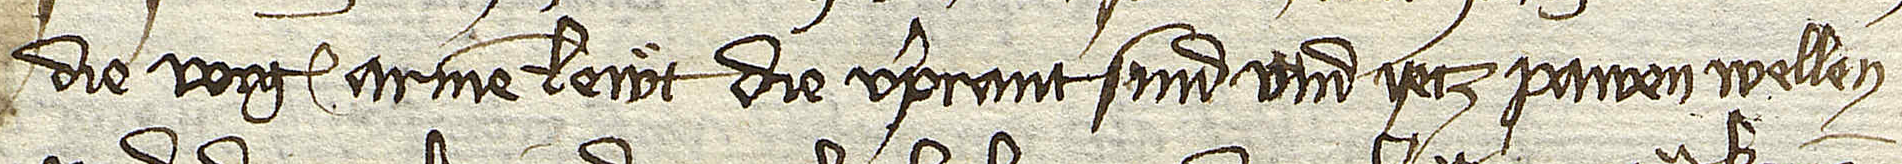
die vorg* arme* lewt die v*prant ſind vnd yecʒ pawen wellen
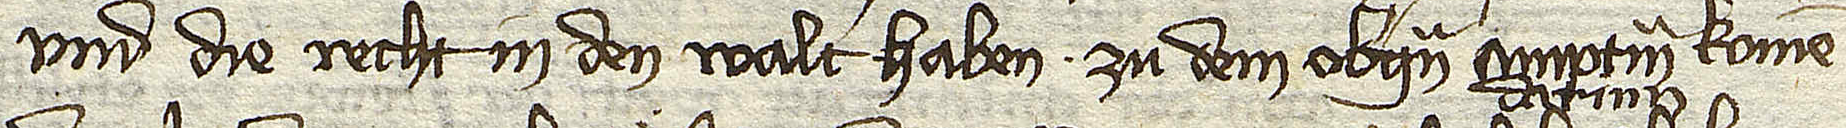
vnd die recht in den walt haben . ʒu dem obg*n amptm* kome*
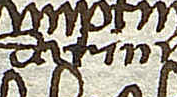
darinn
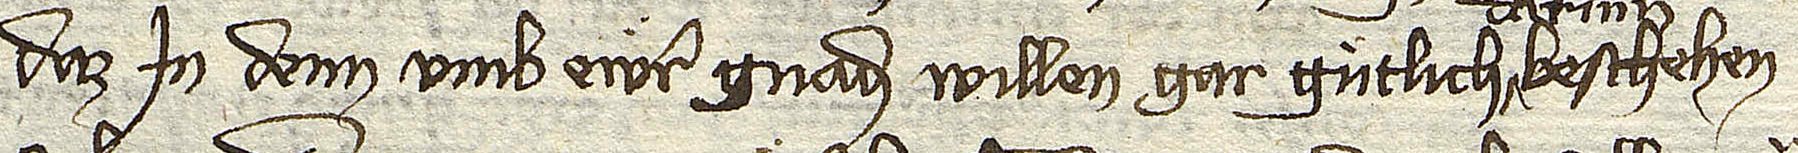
daʒ In denn vmb ewr gnad* willen gar gütlich beſchehen
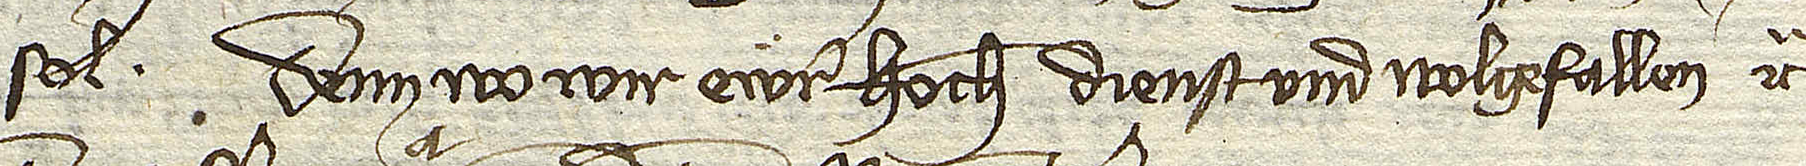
ſol . Denn wo wir ew*r hoch* dienſt vnd wolgefallen ec*
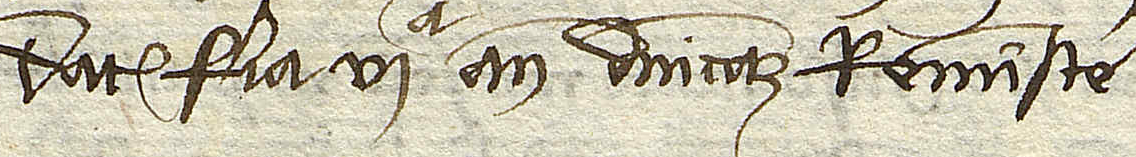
Dat* fia* vi* an* dnica* Remiſce*
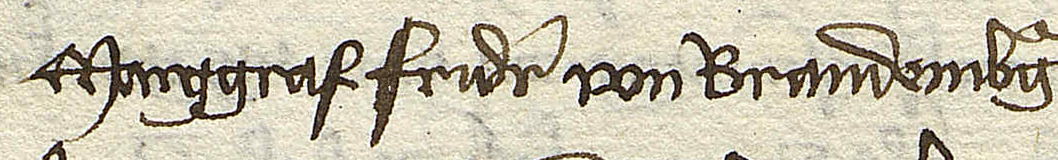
Marggraf Fridr* von Brandemb*g
